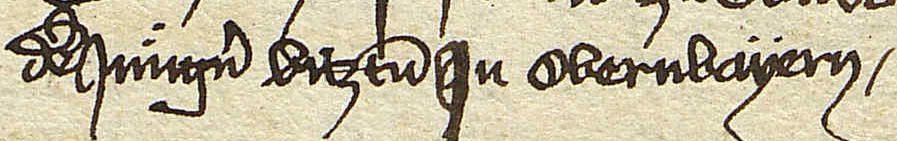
de* Iüngn* vicʒtu* In Obernbayern /
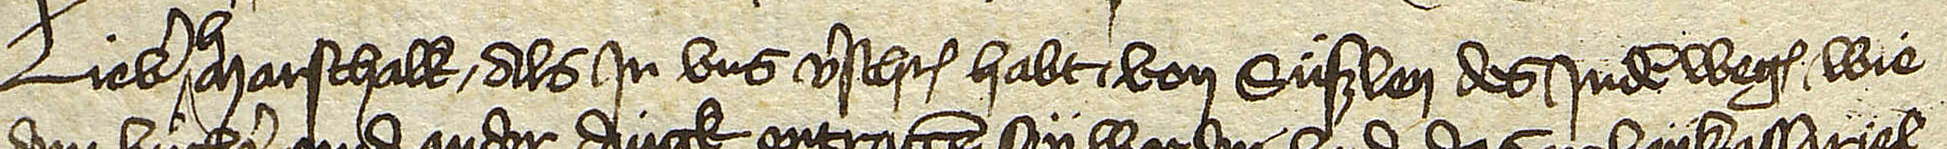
Lieb* Marſchalk / Als Ir vns v*ſchr* habt / von Süſʒlen des Iude* weg* wie
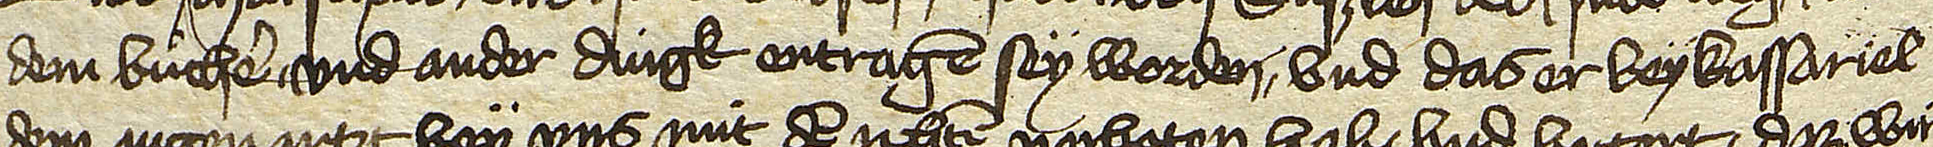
dem büche* vnd ander dingk* entrage* ſey worden / vnd das er bey kaſſariel
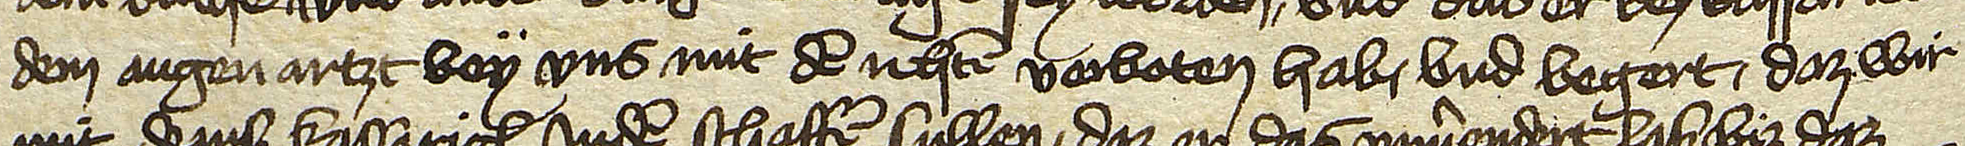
dem augenartʒt bey vns mit d* rehte* verboten hab / vnd begert / daʒ wir
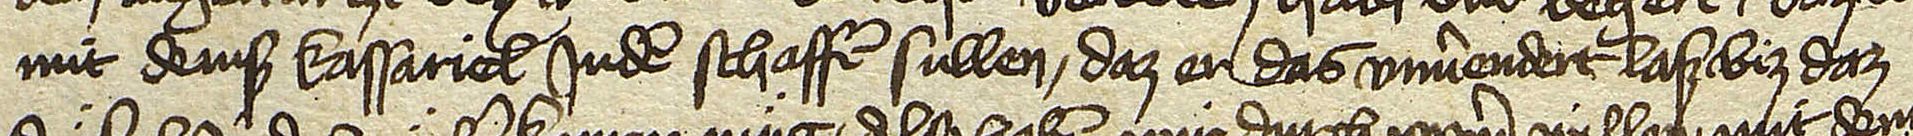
mit demſ* kaſſariel Iude* ſchaffe* ſullen / daʒ er das vnu*endert laſʒ / biʒ daʒ
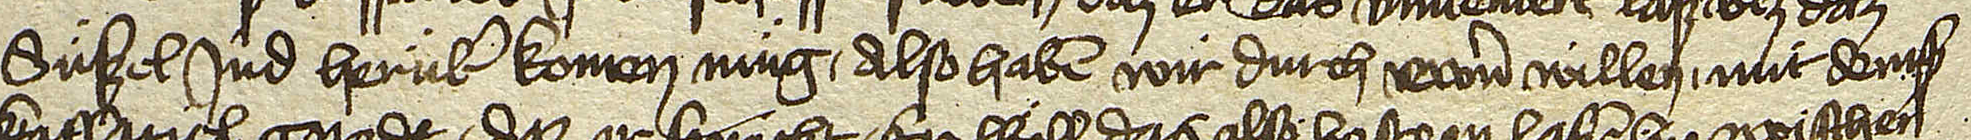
Süſʒel Iud herüb* komen müg / Alſo habe* wir durch ewn* willen / mit demſ*
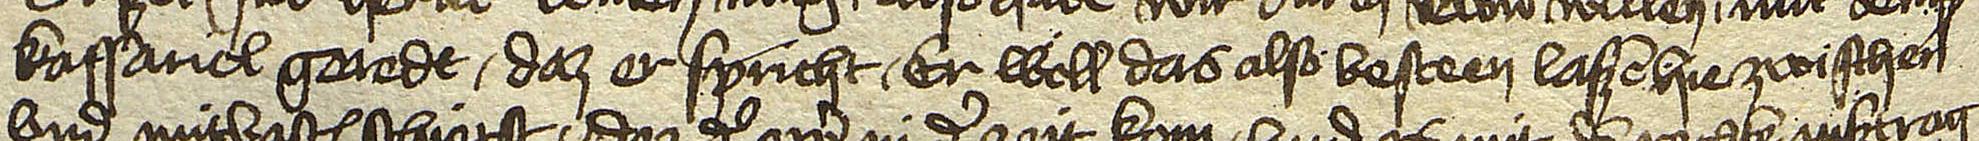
kaſſariel geredt / daʒ er ſpricht / Er wöll das alſo beſteen laſʒe* hiecʒwiſchen
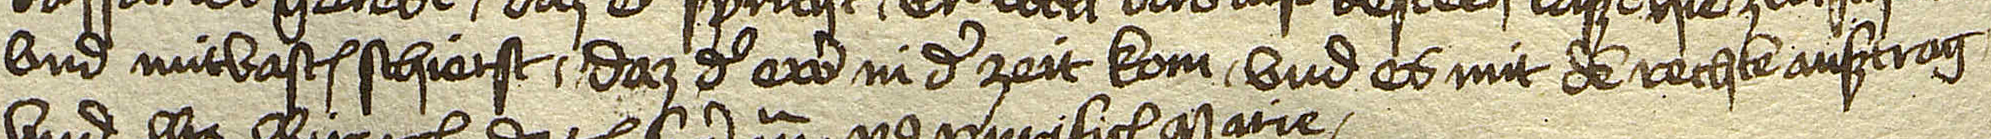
vnd mitvaſt* ſchierſt / daʒ d* ew* in d* ʒeit kom / vnd es mit de* rechte* auſʒtrag
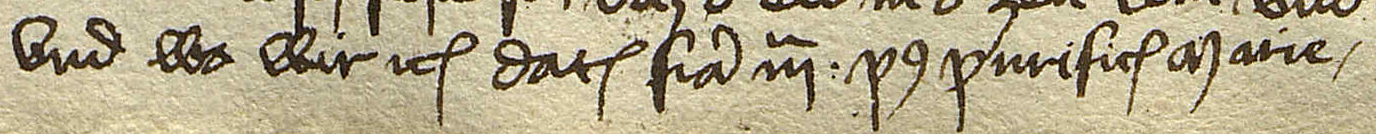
vnd wo wir ec* dat* fia* iii* p* purific* Marie /
